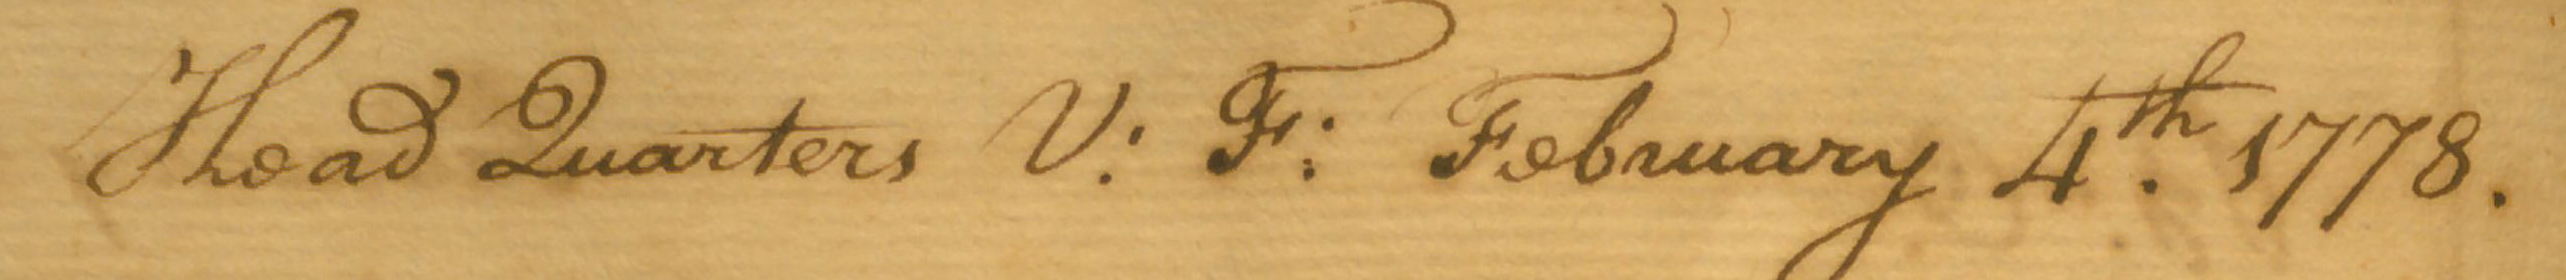Head Quarters V: F: February 4^th. 1778.
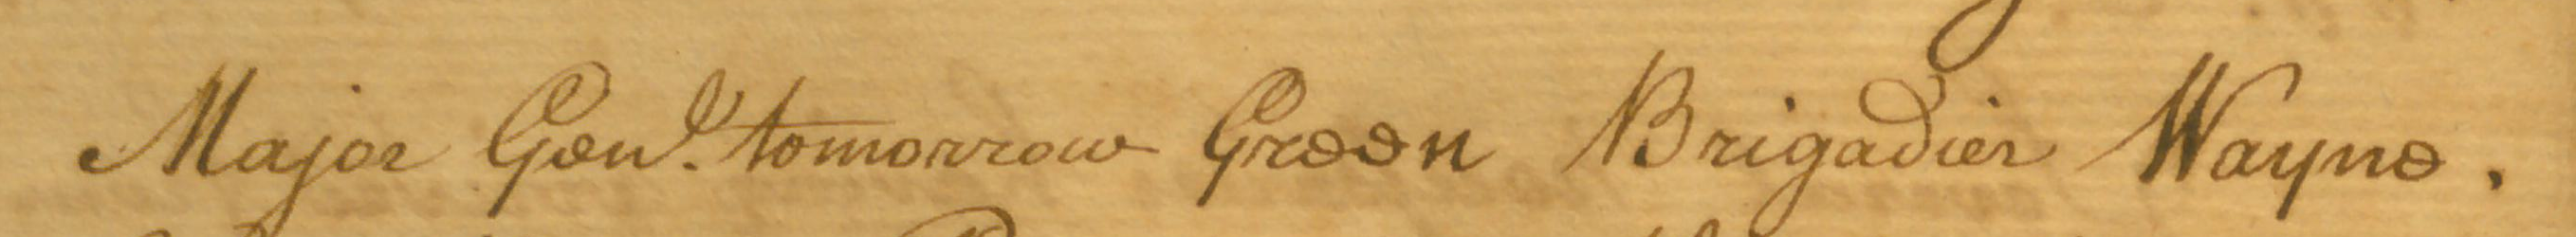Major Gen^l. tomorrow Green Brigadier Wayne.
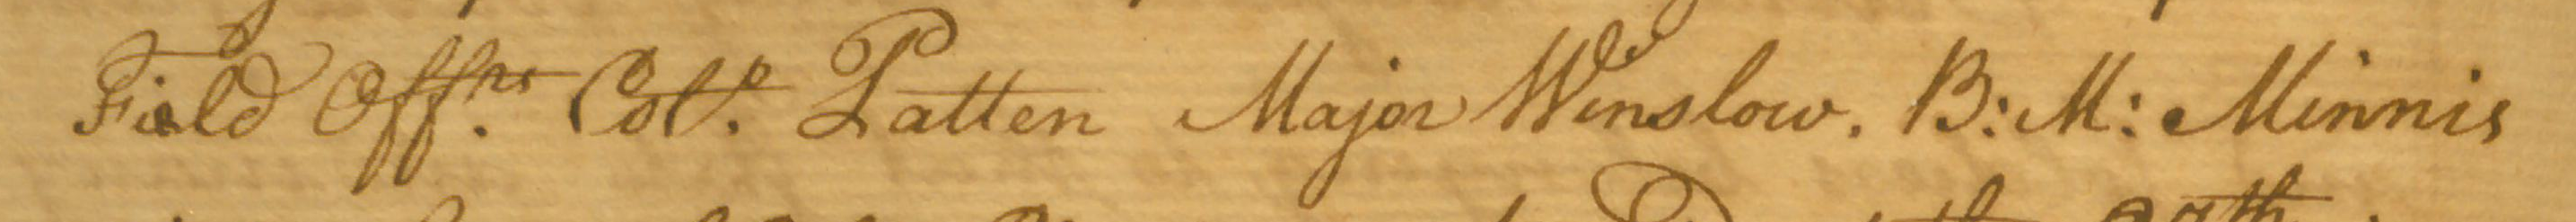Field Off^rs. Col^o. Patten Major Winslow. B: M: Minnis
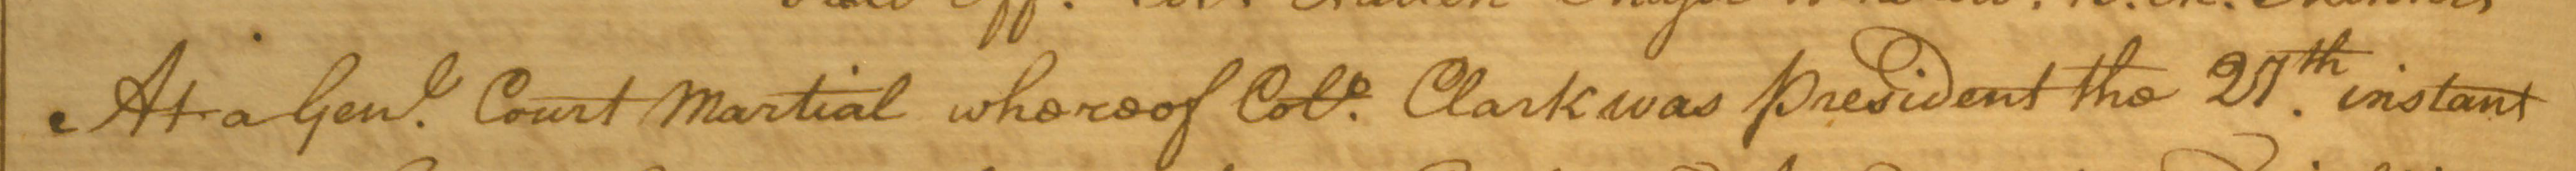At a Gen^l. Court Martial whereof Col^o. Clark was President the 27^th. instant
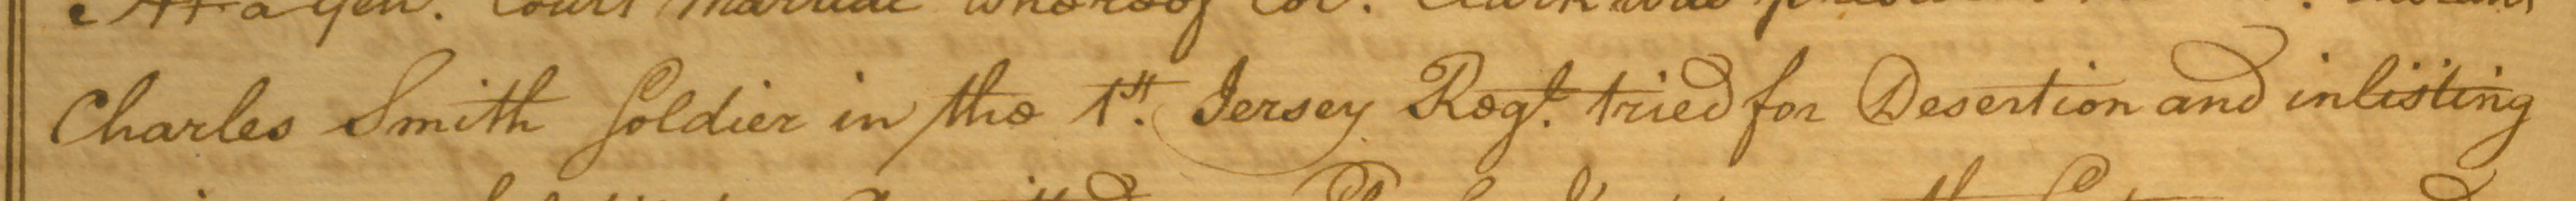Charles Smith soldier in the 1^st. Jersey Reg^t. tried for Desertion and inlisting
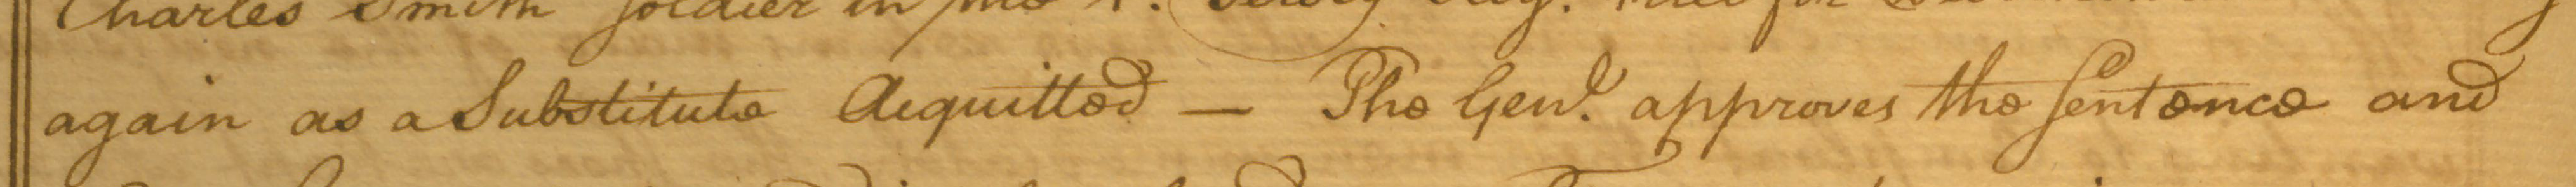again as a Substitute Acquitted- The Gen^l. approves the sentence and
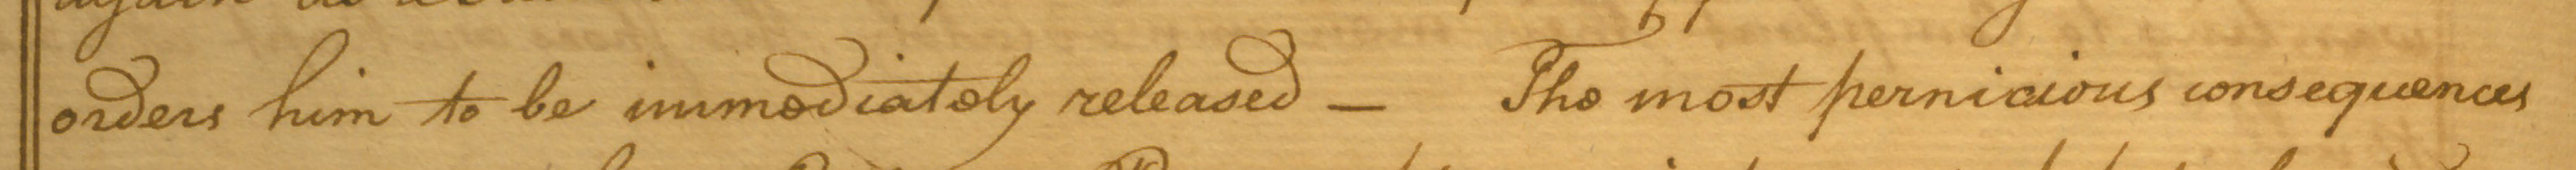orders him to be immediately released- The most pernicious consequences
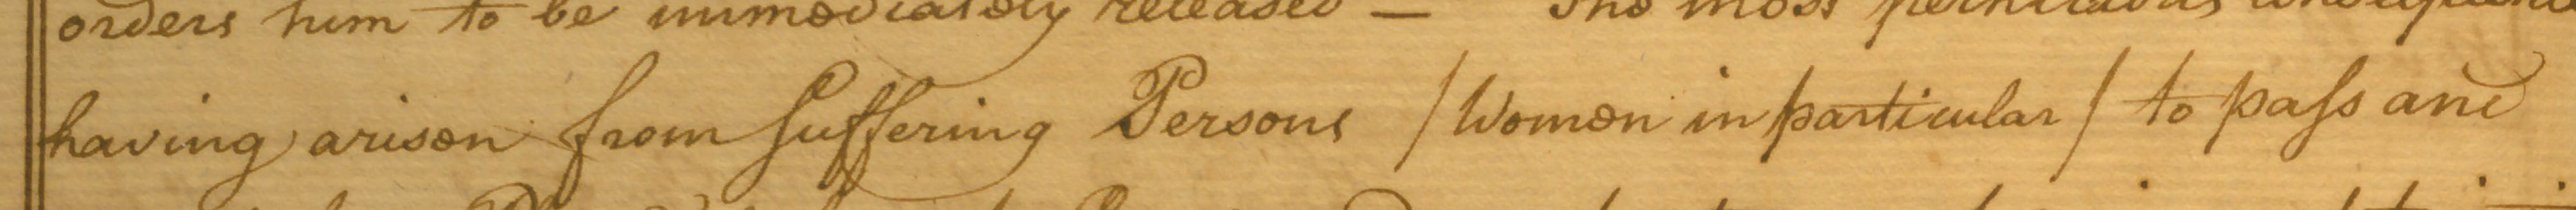having arisen from suffering Persons /women in particular/ to pass and
